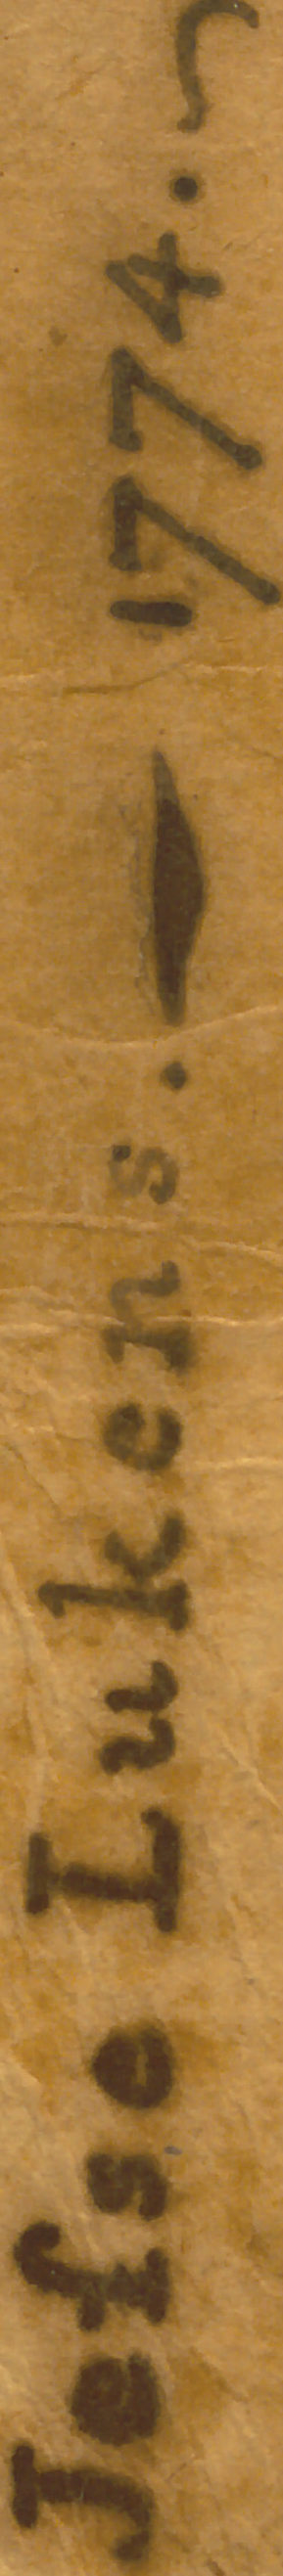Jesse Lukens.- 1774.-
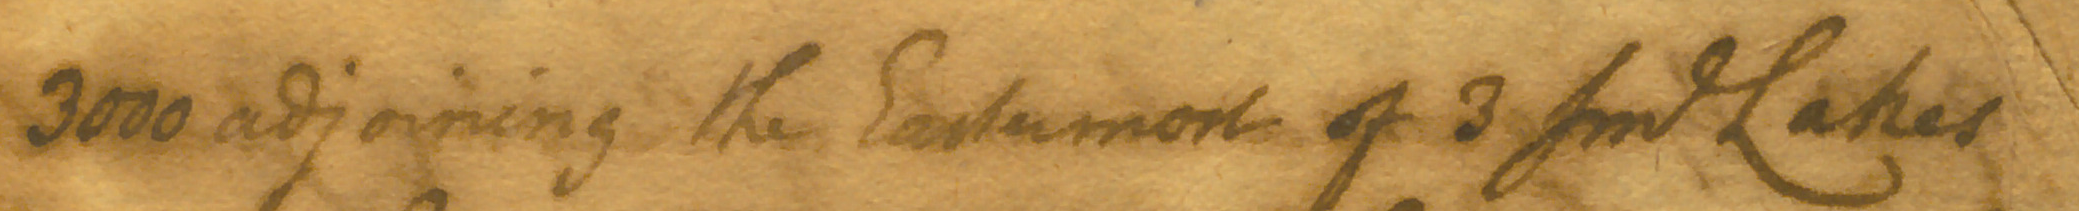3000 adjoining the Easternmost of 3 sm^l Lakes
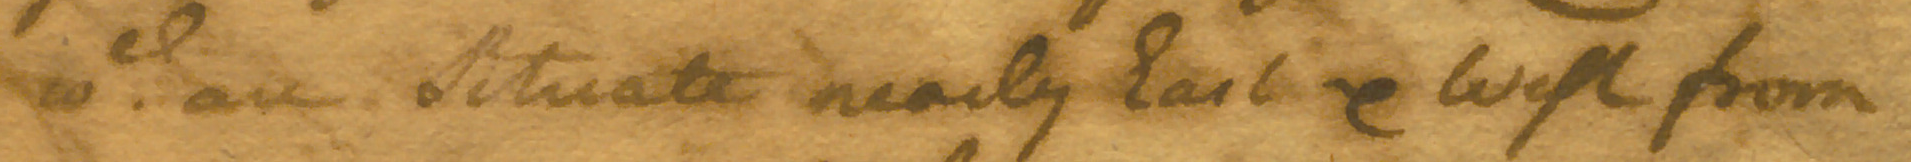w^ch. are situate nearly East & west from
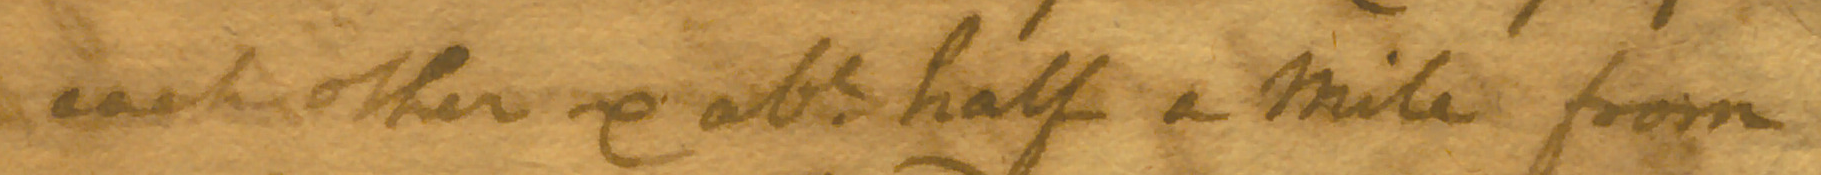each other & ab^t. half a mile from
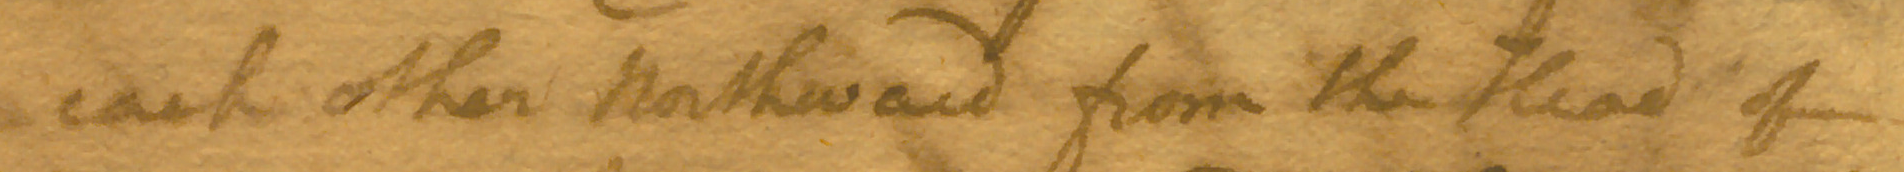each other Northward from the Head of
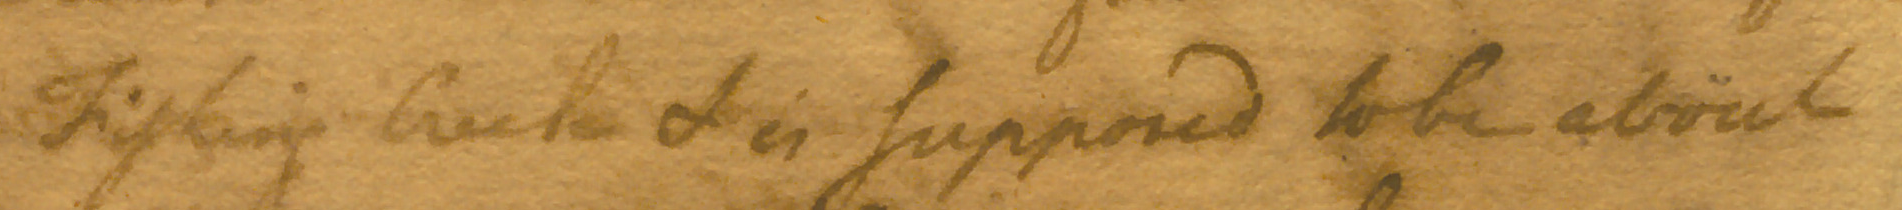Fishing Creek & is supposed to be about
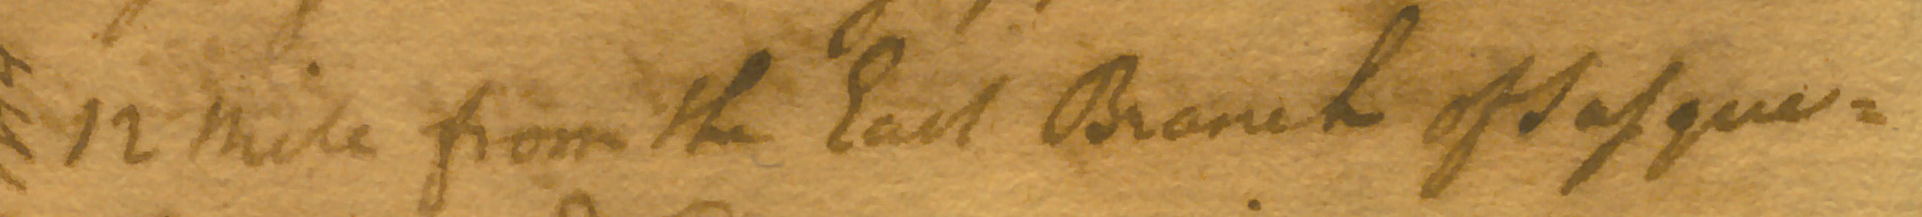12 Mile from the East Branch of Susque-
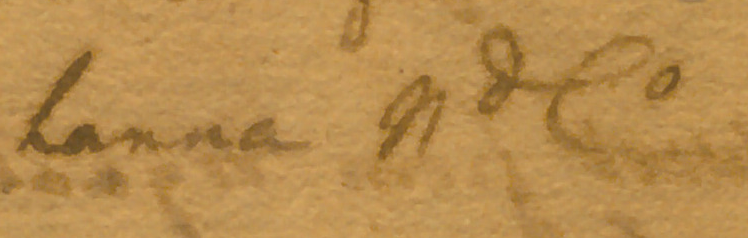hanna n^d C^o
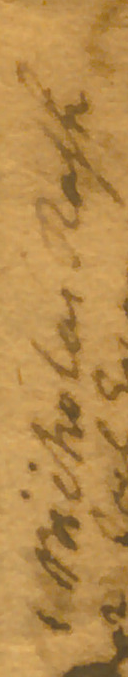nicholas Rash
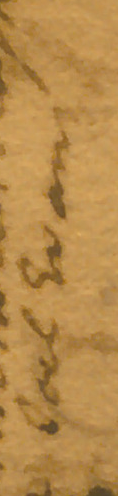Carl Evan
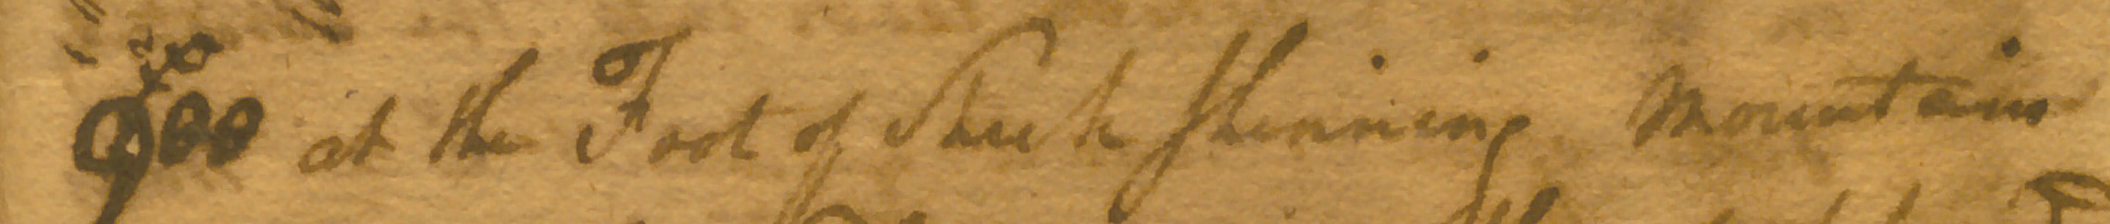900 at the Foot of Shuckshinning Mountain
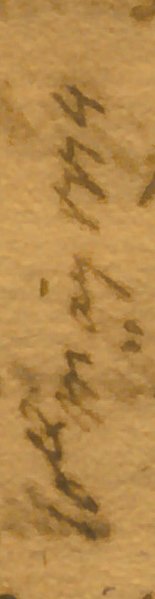10^th May 1774
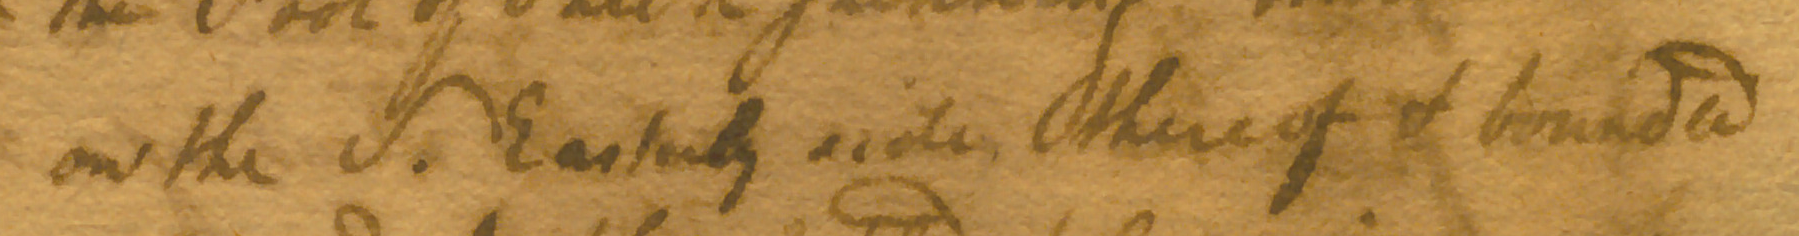on the S. Easterly side thereof & bounded
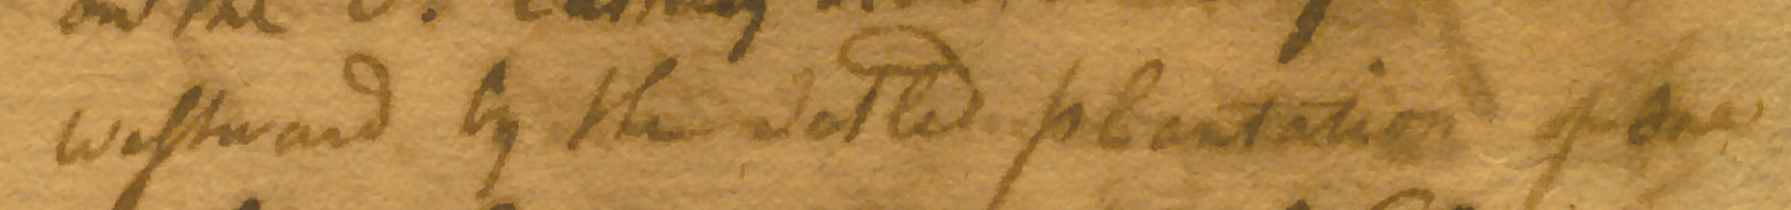westward by the satled plantation of the
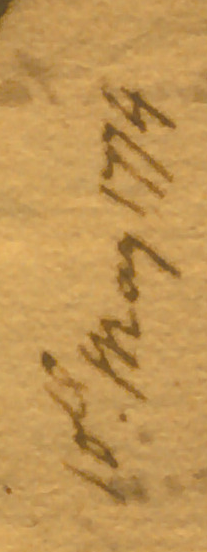10^th. May 1774
